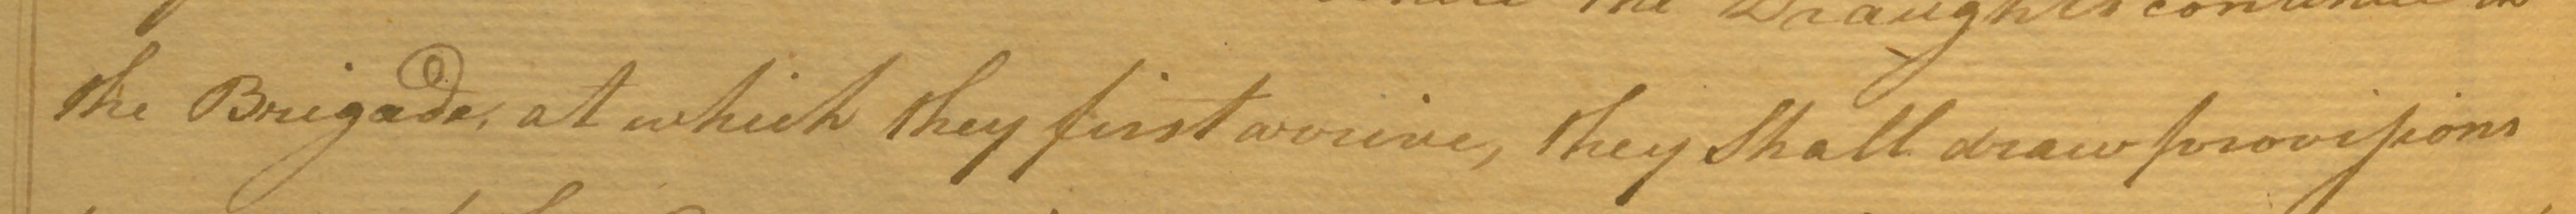the Brigade at which they first arrive, they shall draw provisions
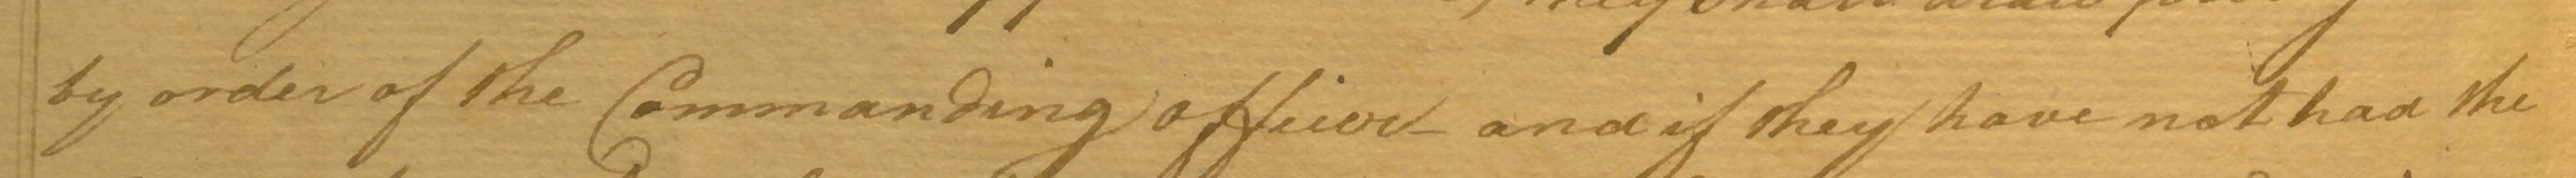by order of the Commanding officer and if they have not had the
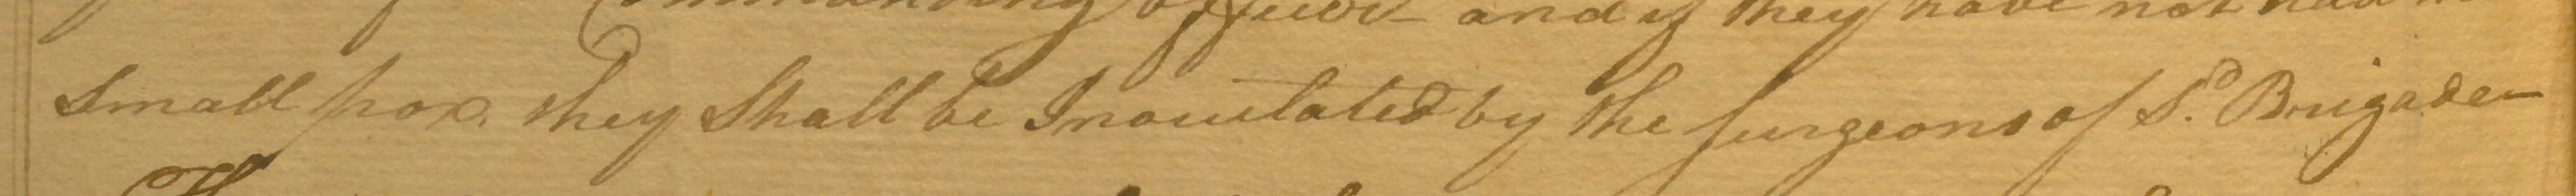smallpox they Shall be inoculated by the surgeons of s^d. Brigade-
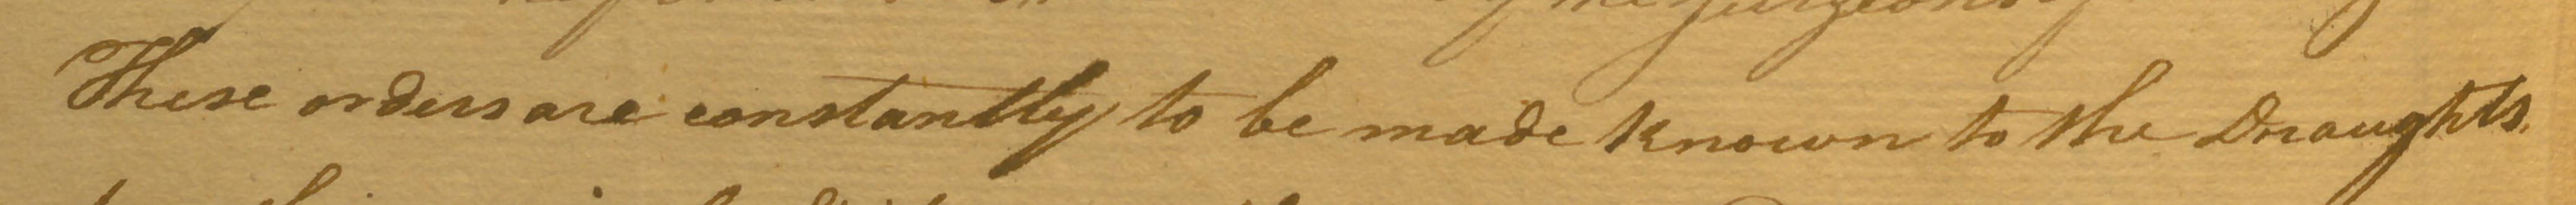These orders are constantly to be made known to the Draughts
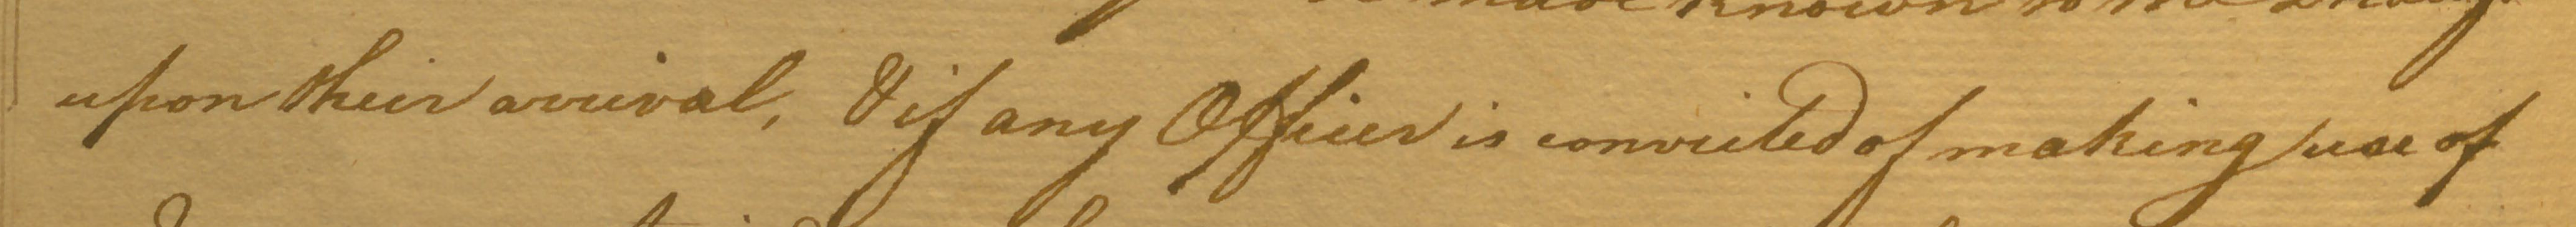upon their arrival, & if any Officer is convicted of making use of
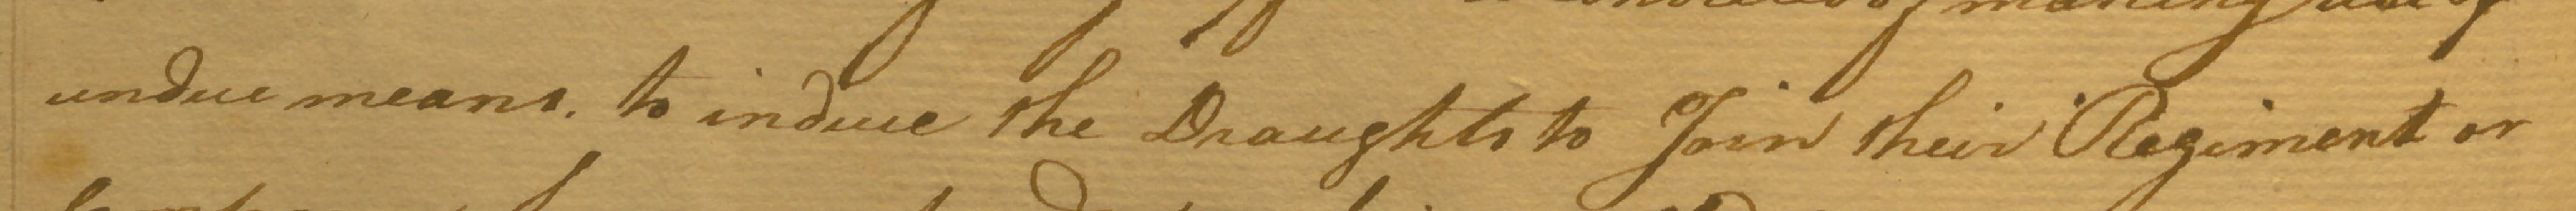undue means to induce the Draughts to Join their Regiment or
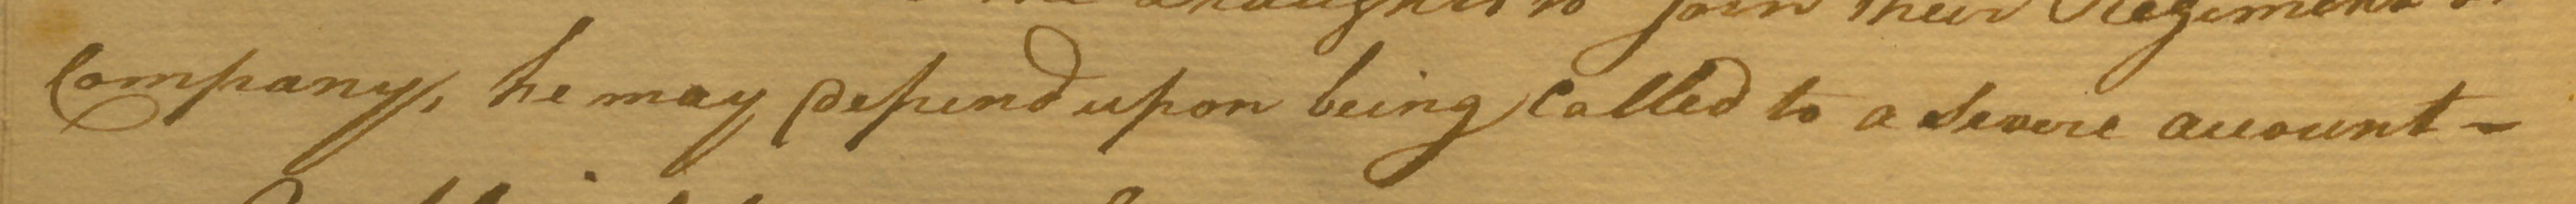Company, he may depend upon being called to a severe account-
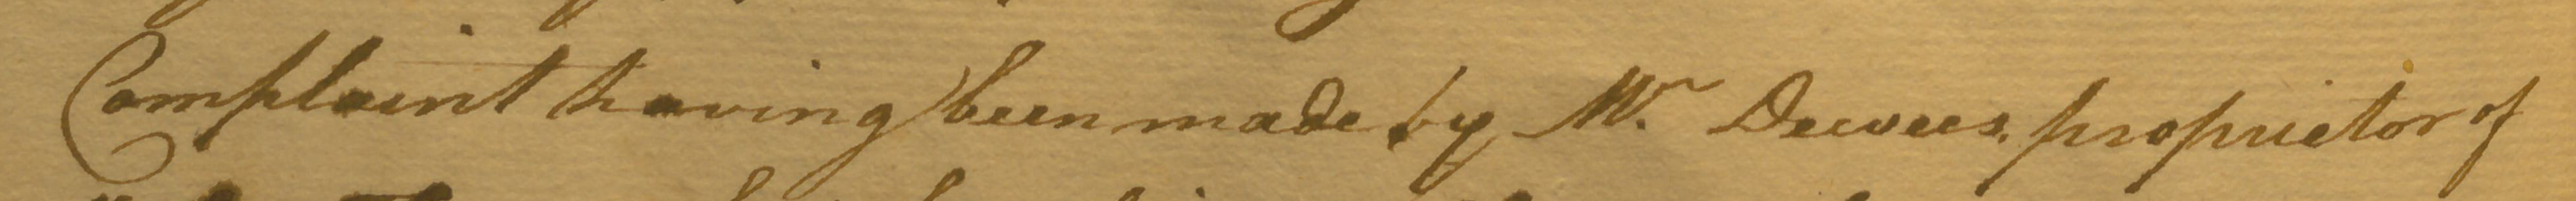Complaint having been made by M^r. Dewees proprietor of
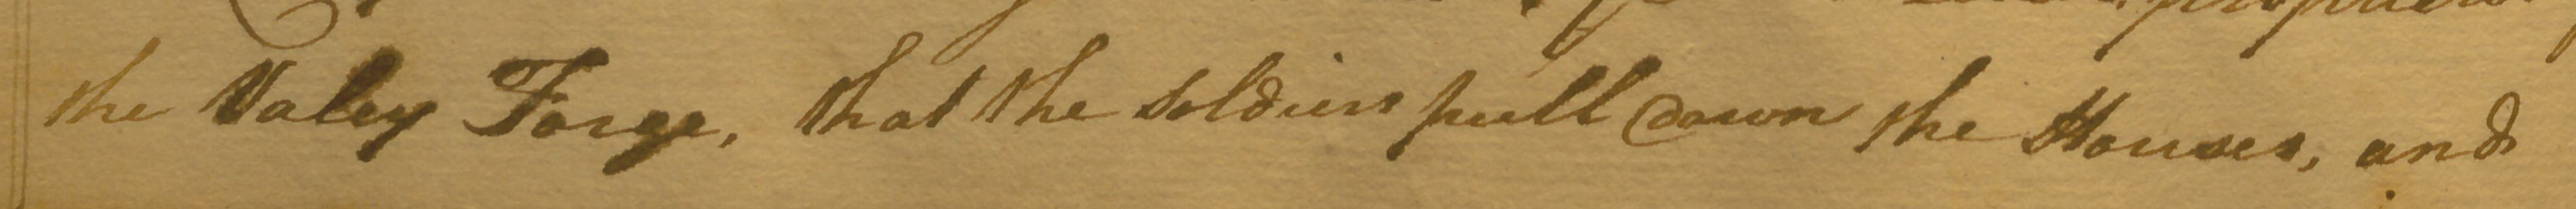the Valey Forge, that the soldiers pull down the Houses, and
